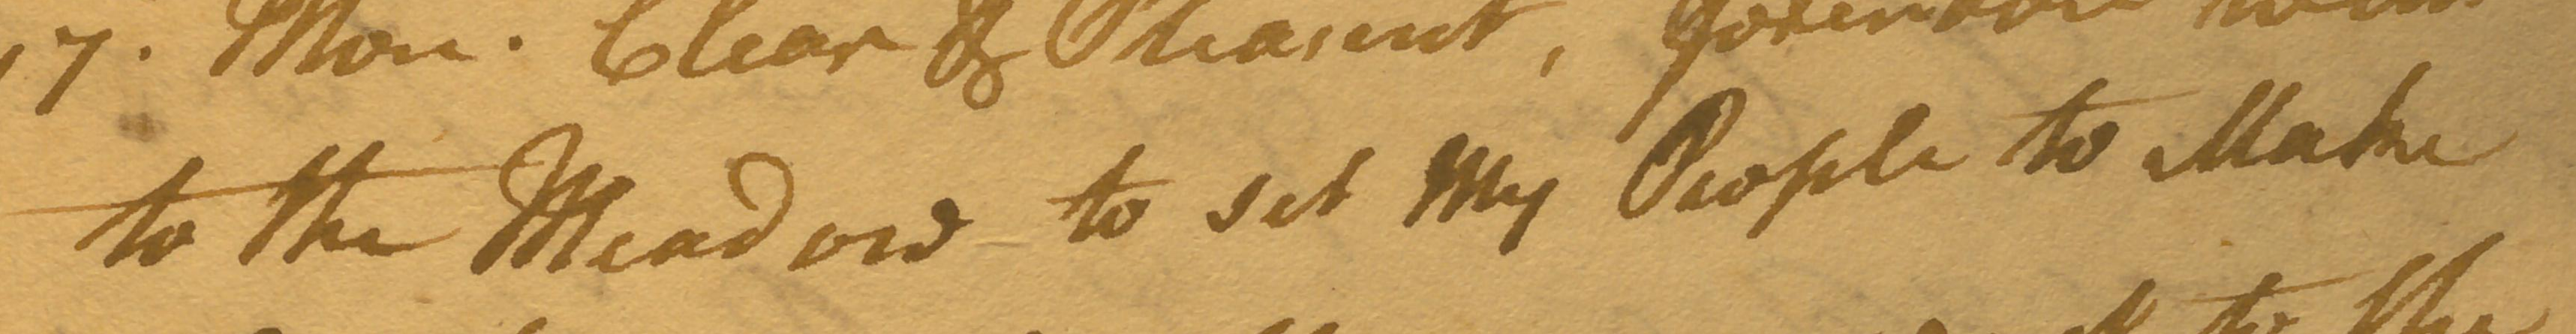to the Meadow to set My People to Make
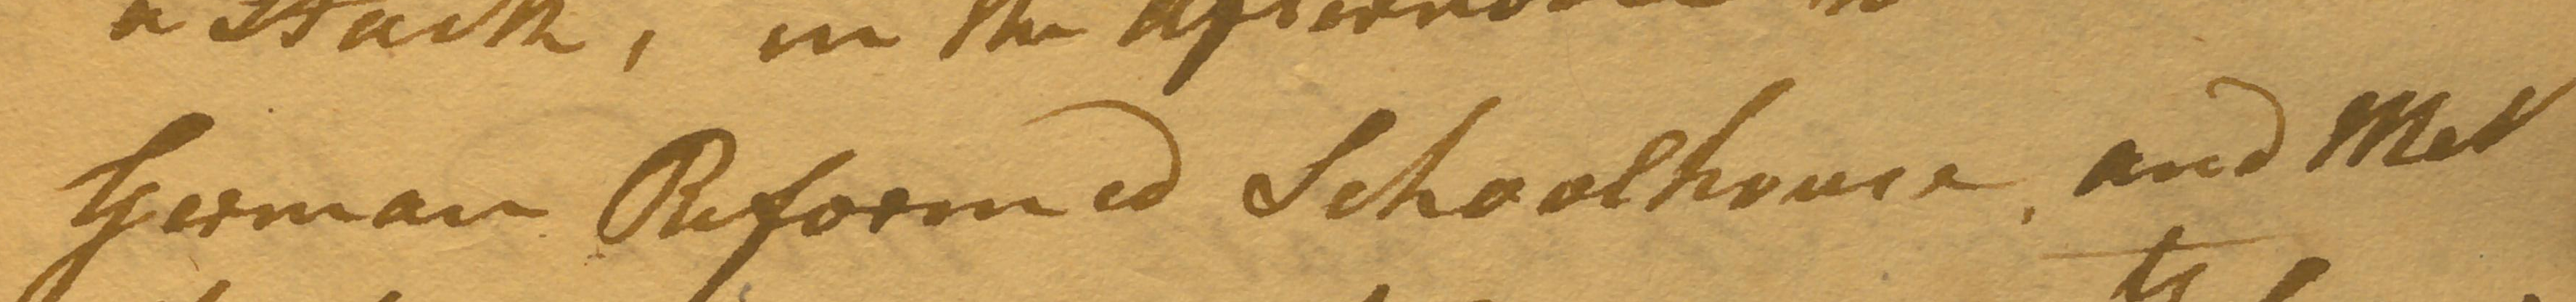German Reformed Schoolhouse and Met
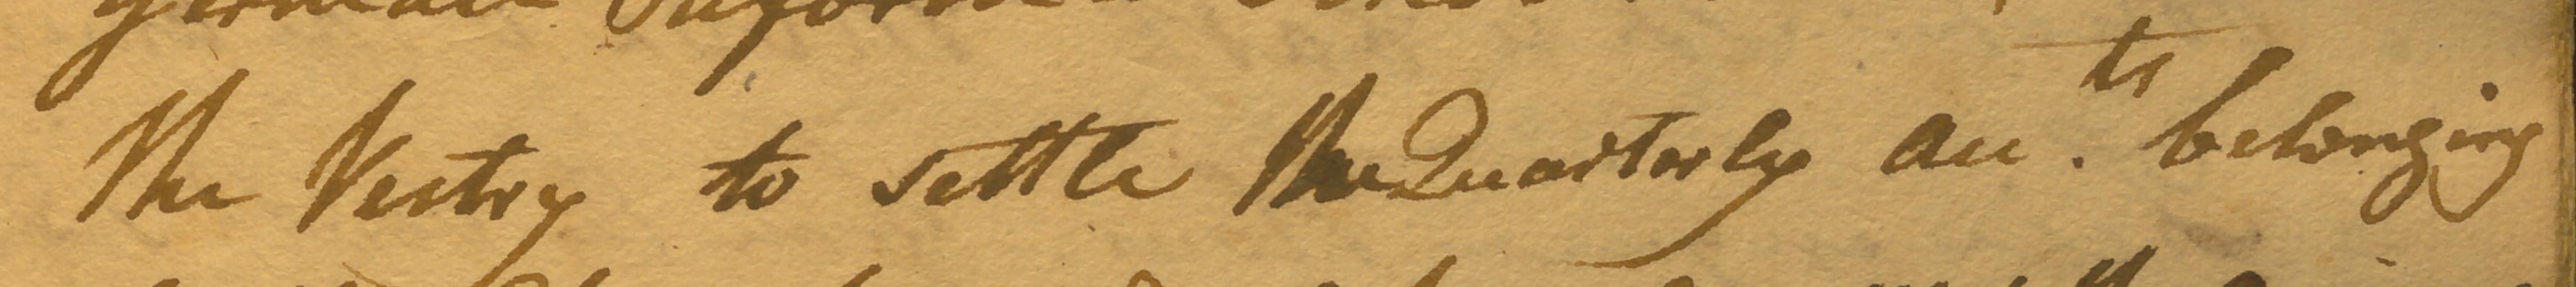The Vestry to settle the Quarterly acc^ts. belonging
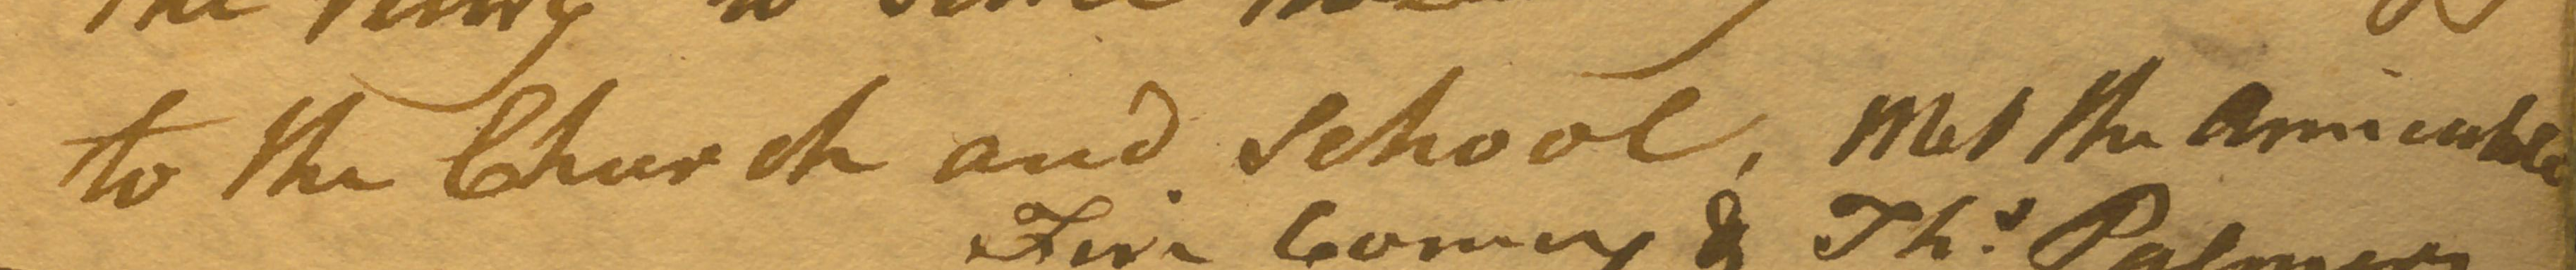to the Church and School, Met the Amicable
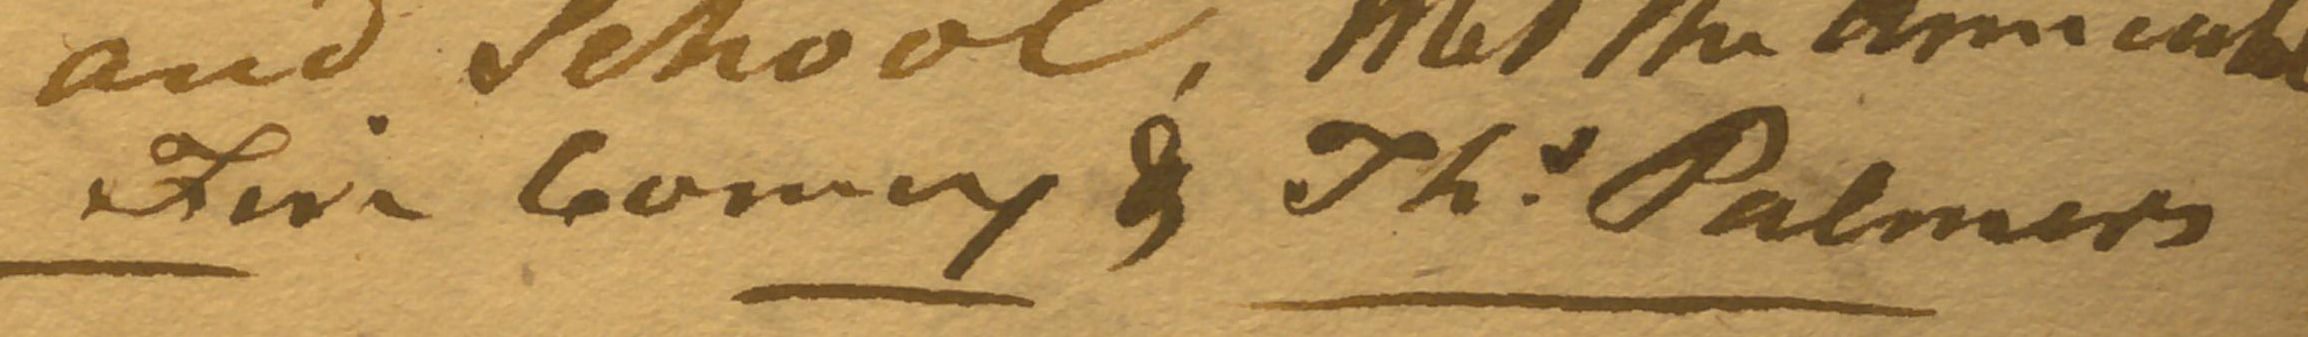Fire Comy & Th^s. Palmers
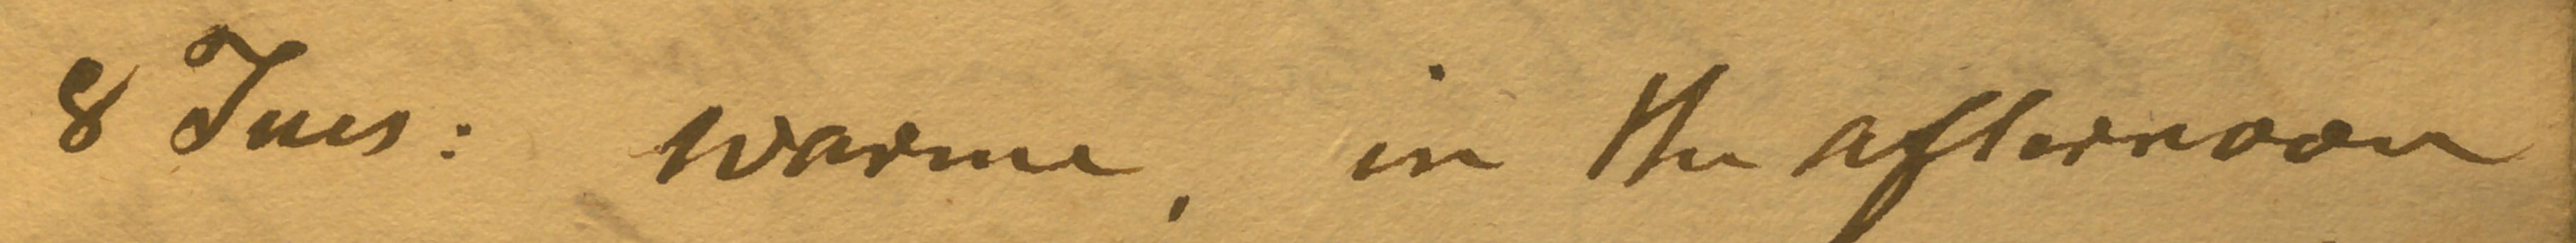8 Tues: warme in the afternoon
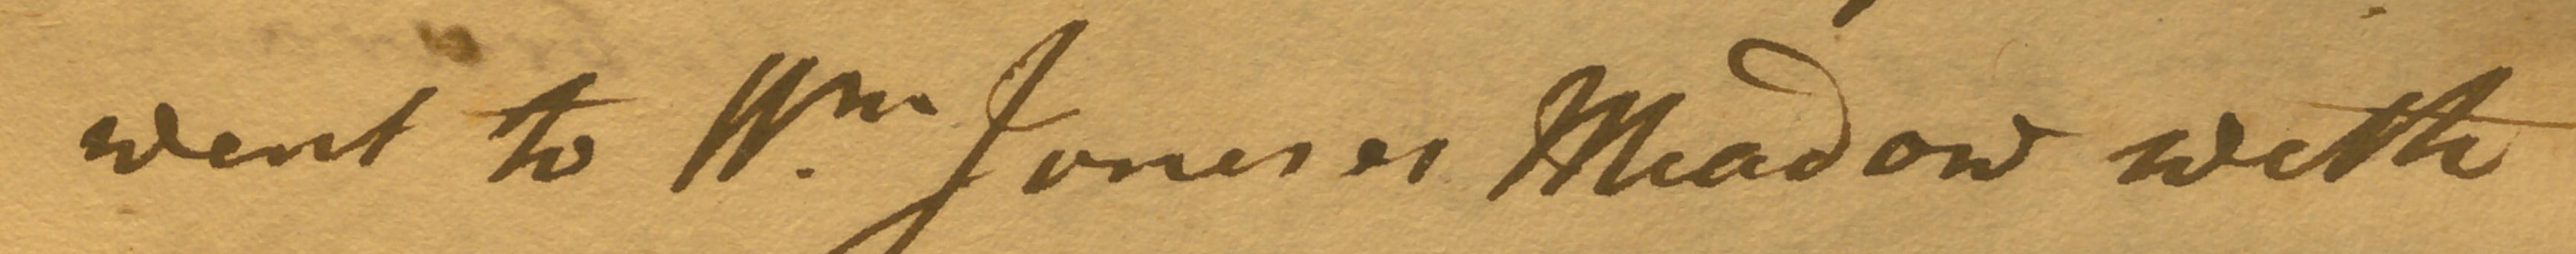went to W^m. Joneses Meadow with
